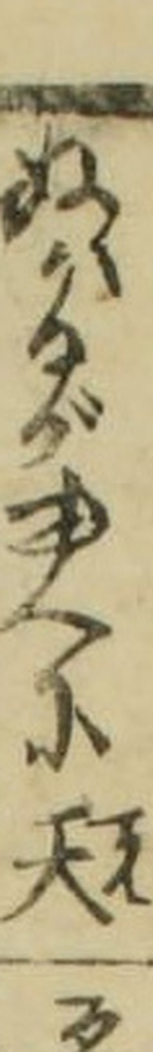ぬかるがゆへに天
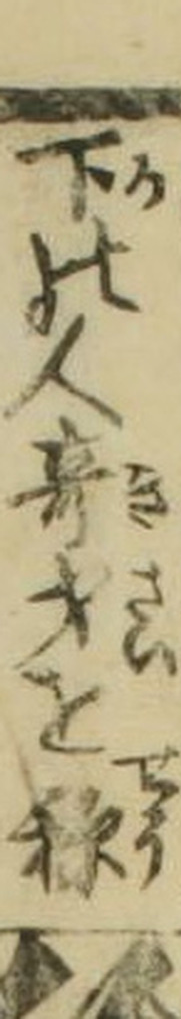下の人奇才を称
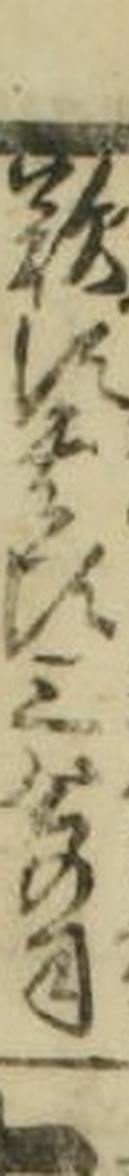歎す其頃三公の司
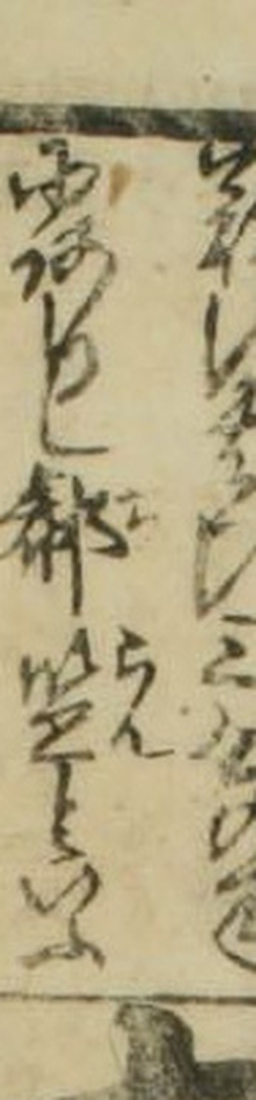にありし郗鑒といふ
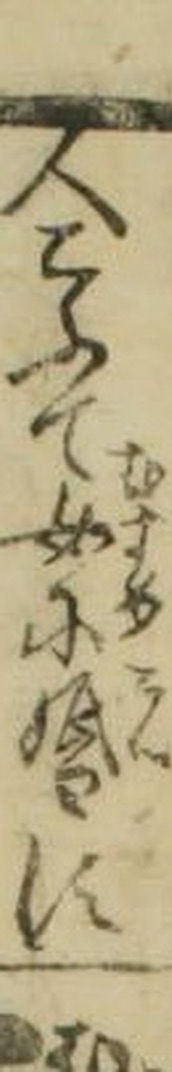人こふて女に婚す
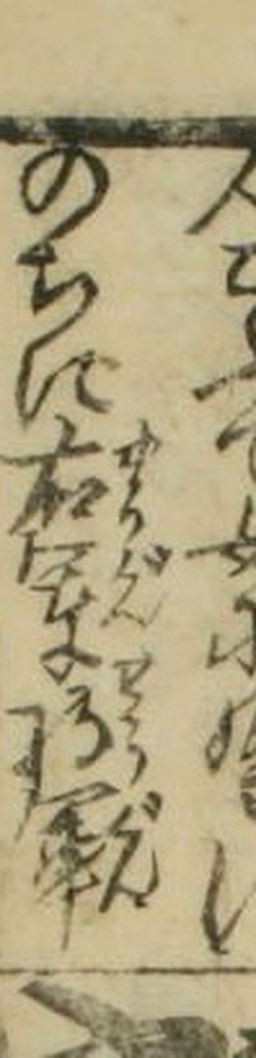のちに右軍將軍
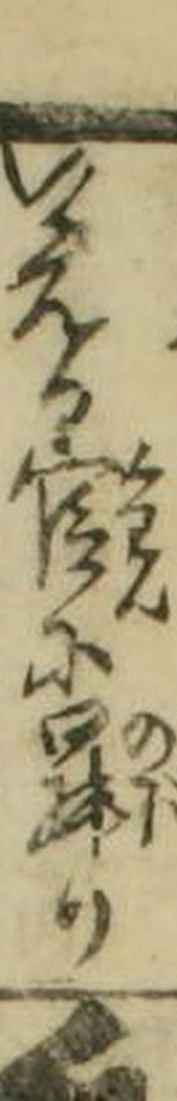いえる官に昇り
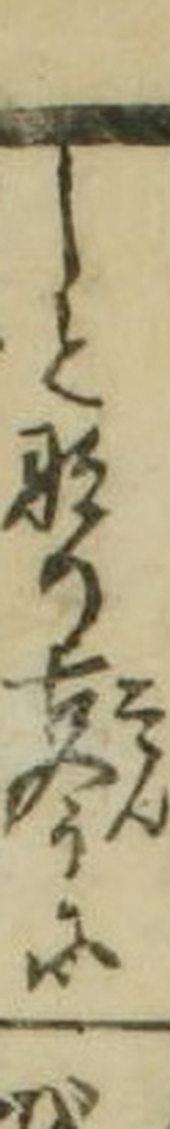しとなり古今に
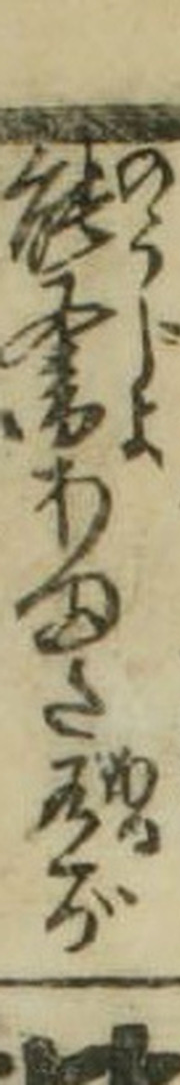能書あまた有が
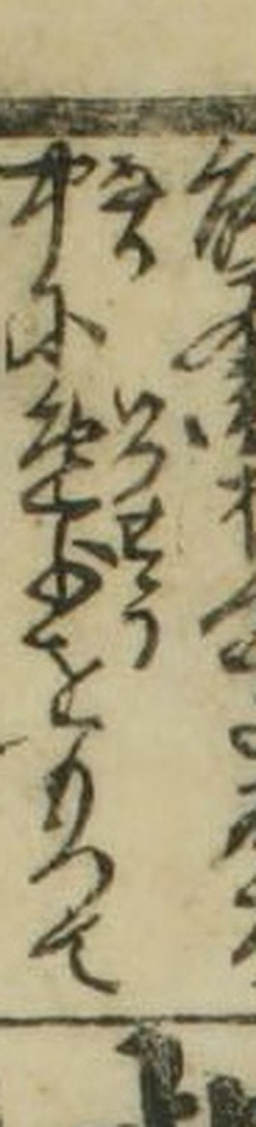中に逸少をもつて
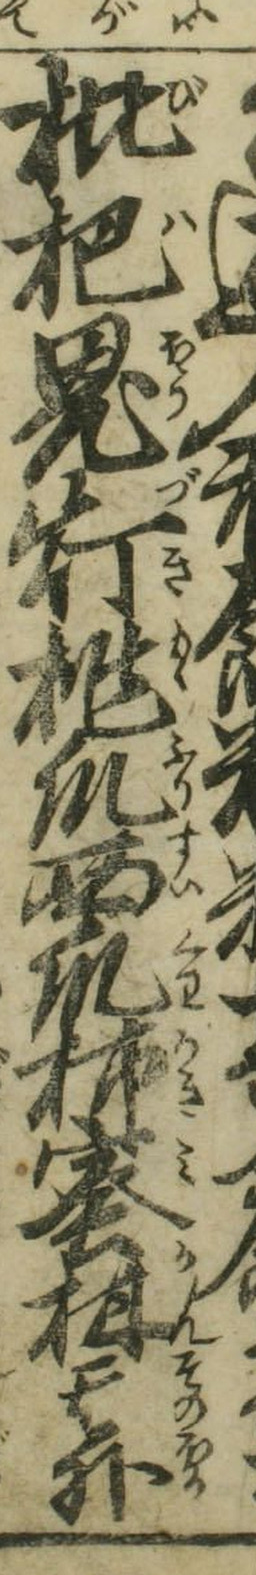枇杷鬼灯桃瓜西瓜柿蜜柑其外
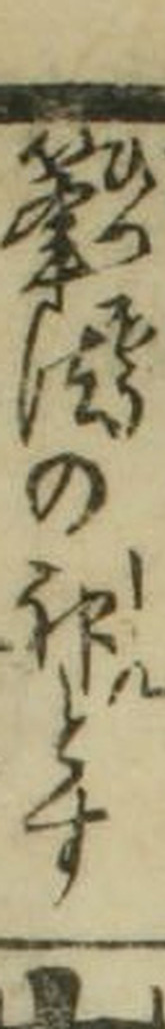筆法の神とす
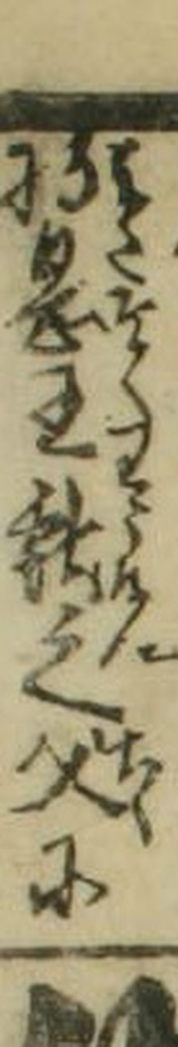將息王献之父に
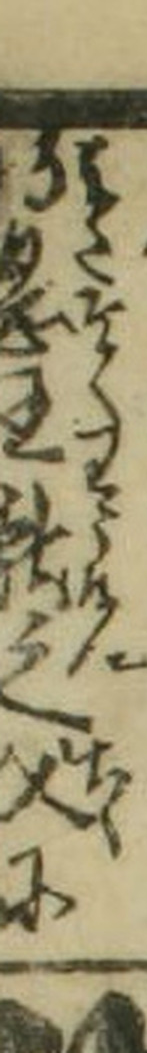將息王献之父に
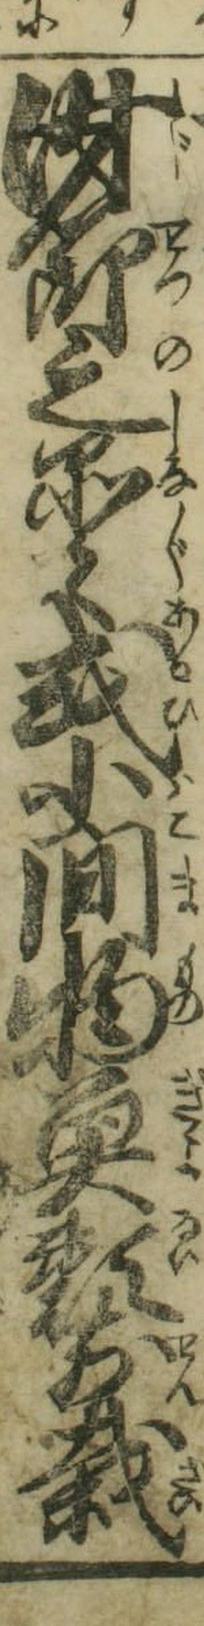時節之品々或小間物魚類前栽
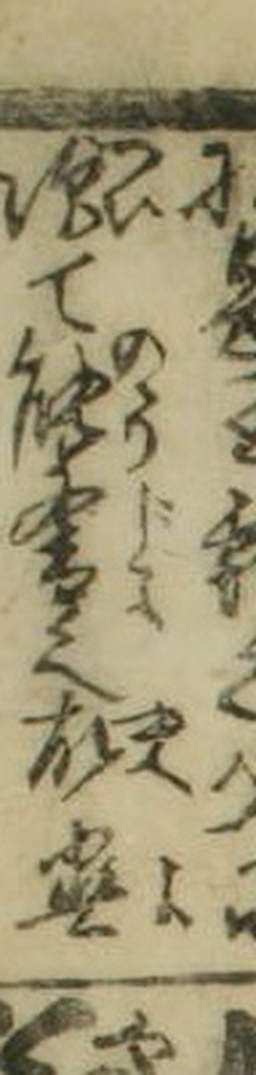次て能書也故與
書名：増補職人往来
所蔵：東京学芸大学教育コンテンツアーカイブ
